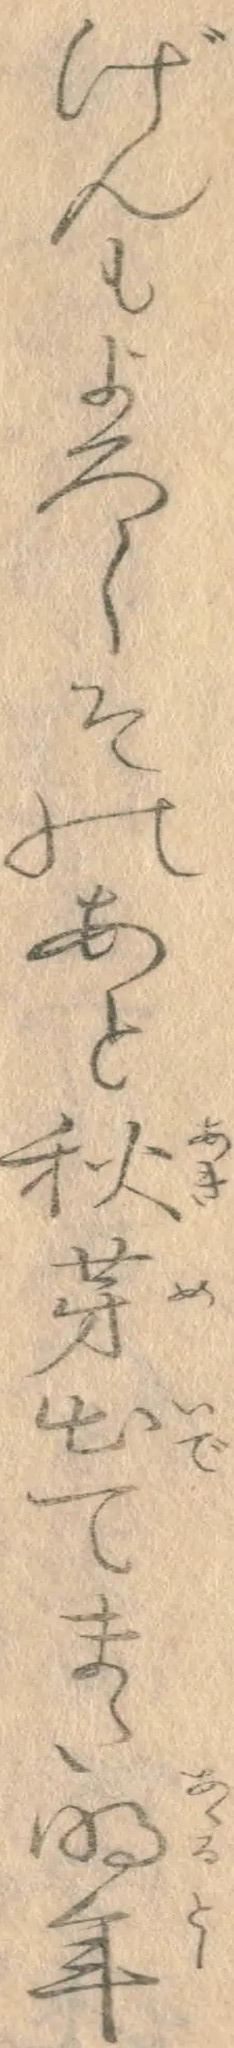げんもよろしそのあと秋芽出てまた明年
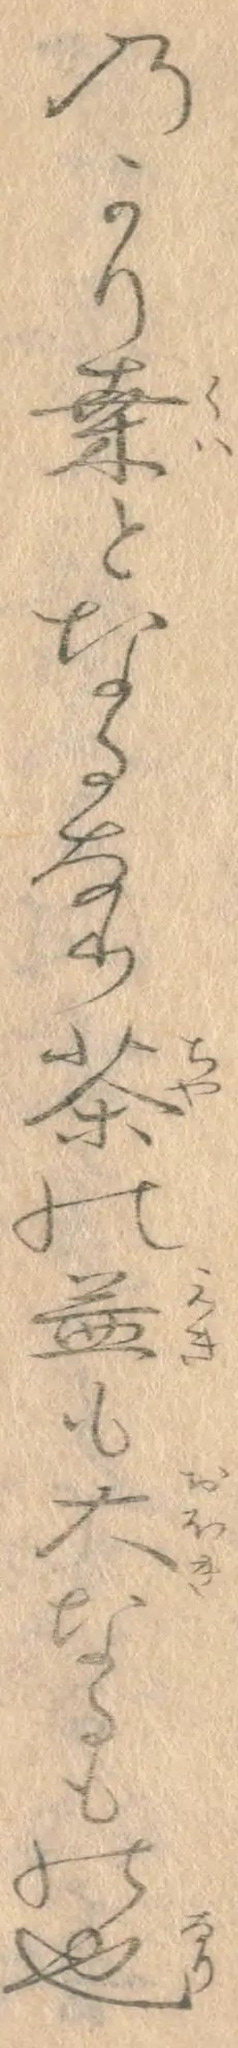のかり桑となるなり茶の益も大なるもの也
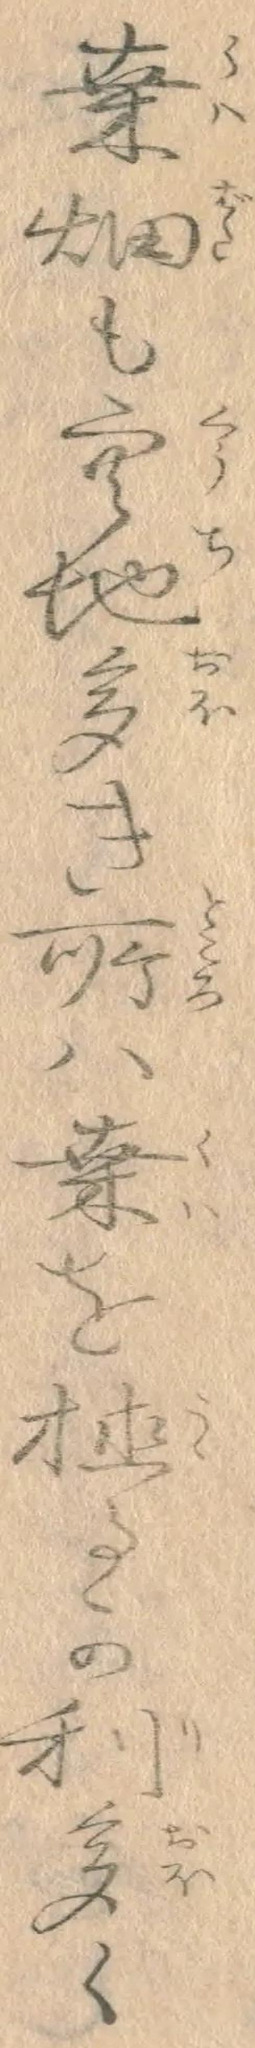桑畑も空地多き所は桑を植るか利多く
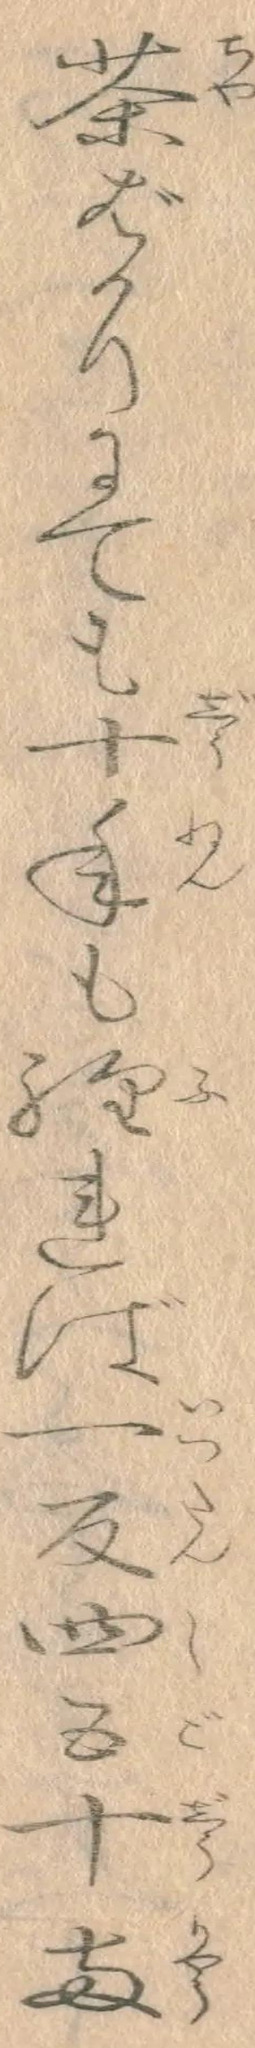茶ばかりにても十年も経れば一反四五十両
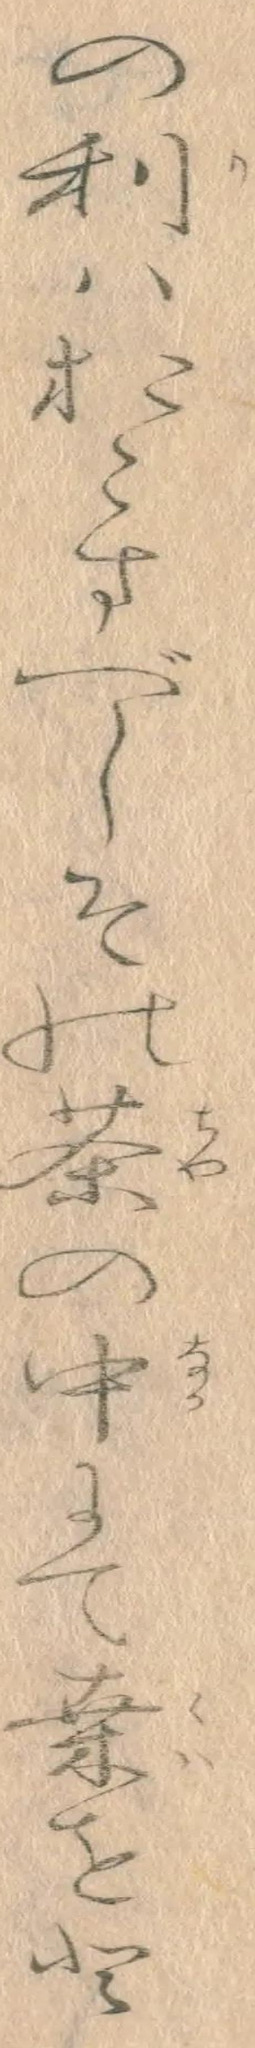の利はおこすべしその茶の中にて桑をと
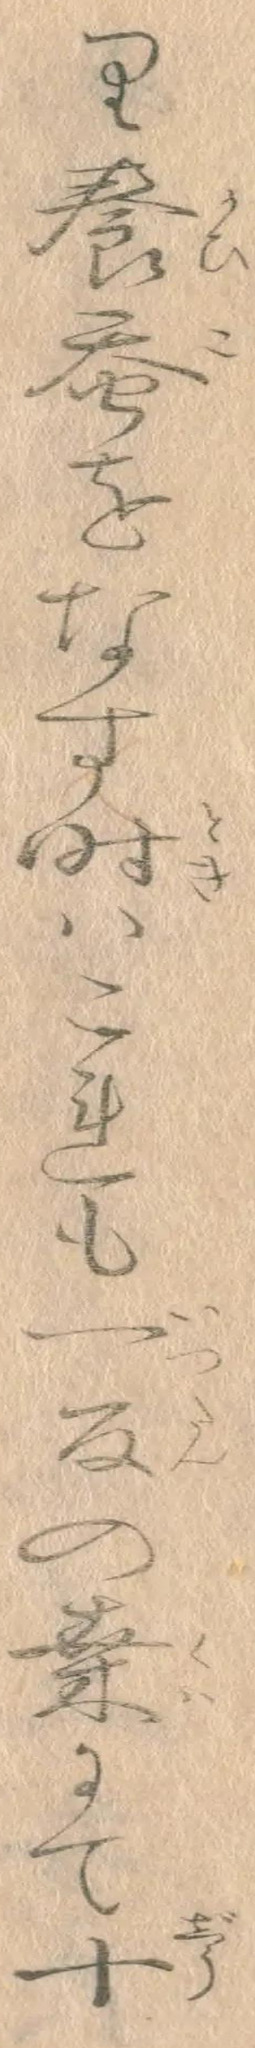り養蚕をなす時はこれも一反の桑にて十
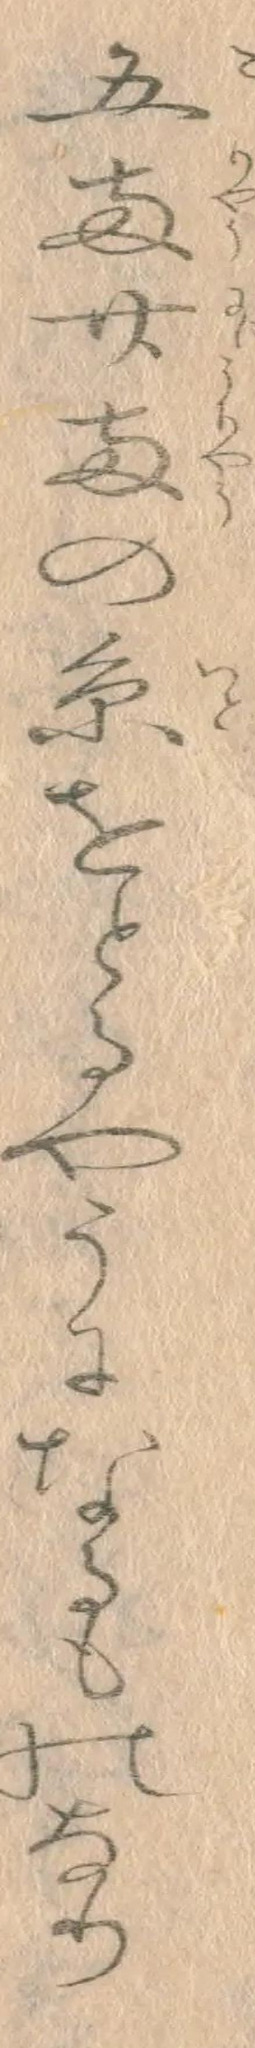五両廿両の糸をとるやうになるものなり
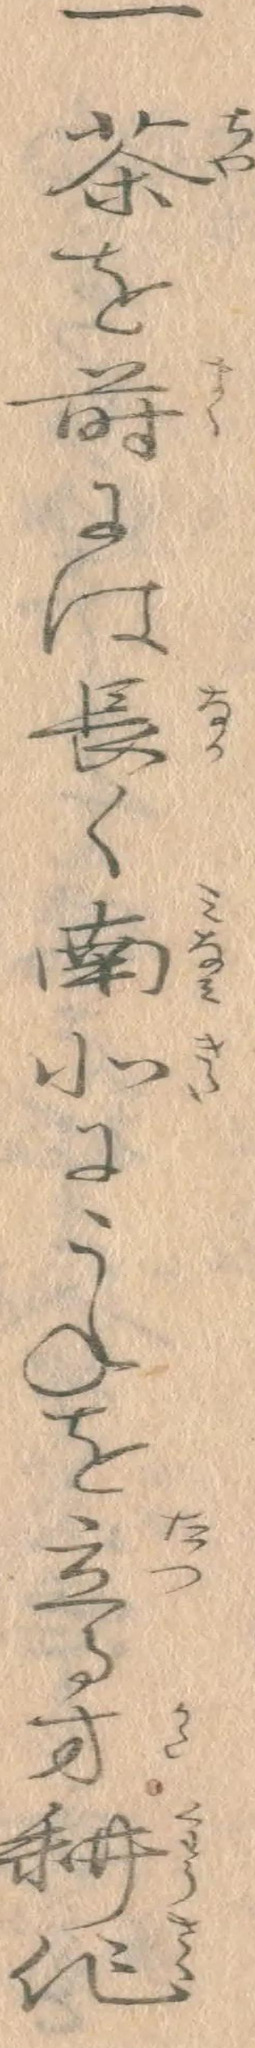一茶を撒く蒔には長く南北にうねを立る方耕作
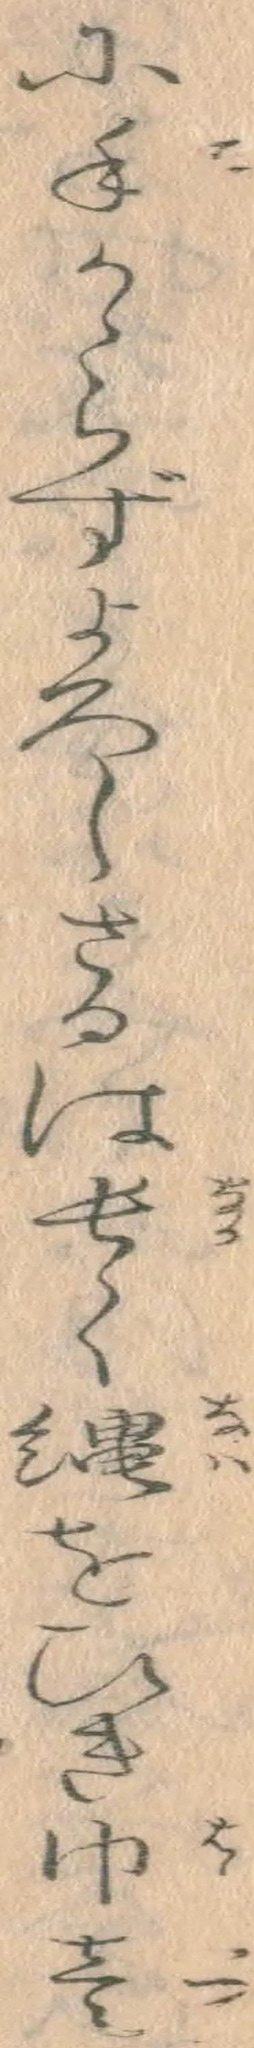に手かゝらずよろしさるは長く縄をひき巾壱
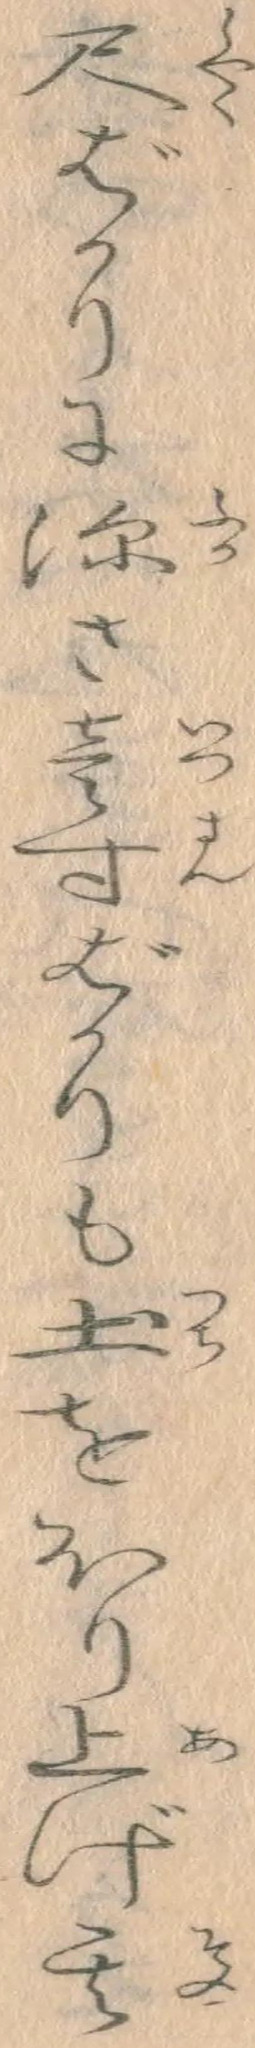尺ばかりに深さ壱寸ばかりも土をほり上げ其
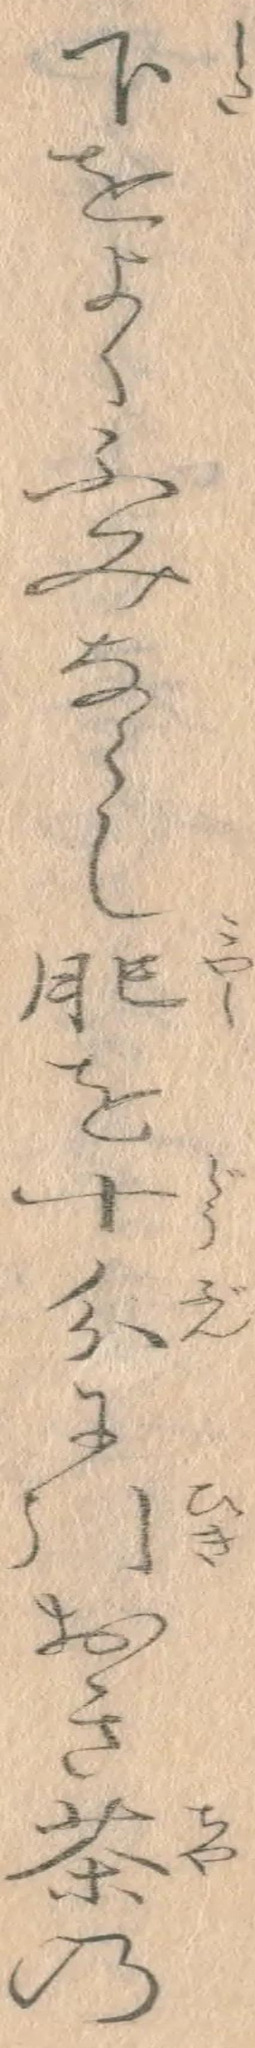下をよくふみならし肥を十分に引おき茶の
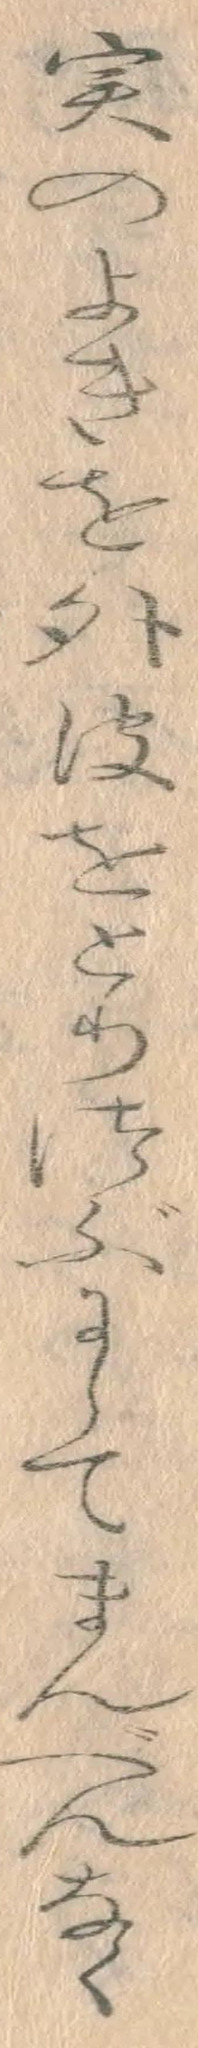実のよきを外皮をとりつぶにしてまんべんなく
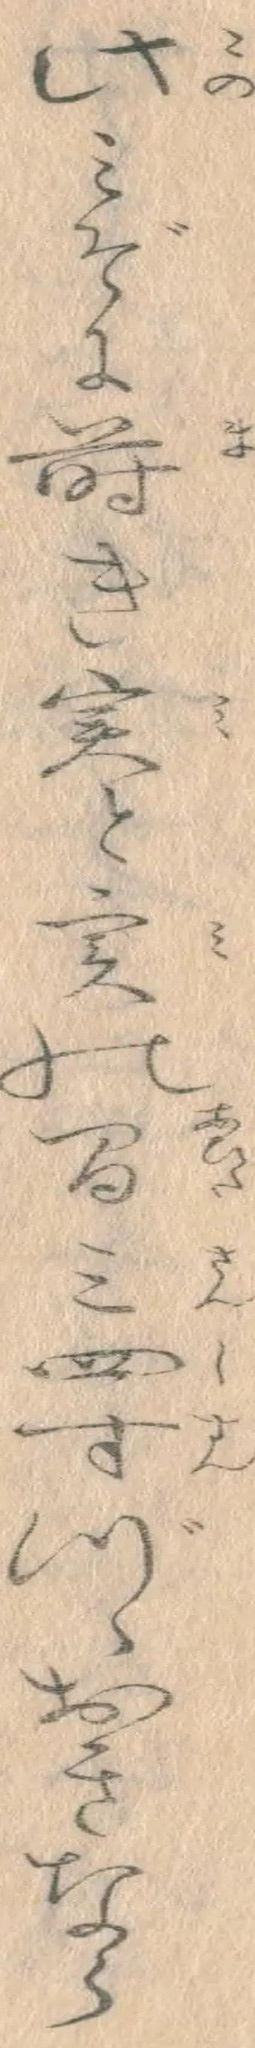此みぞに蒔き実と実の間三四寸づゝおきなら
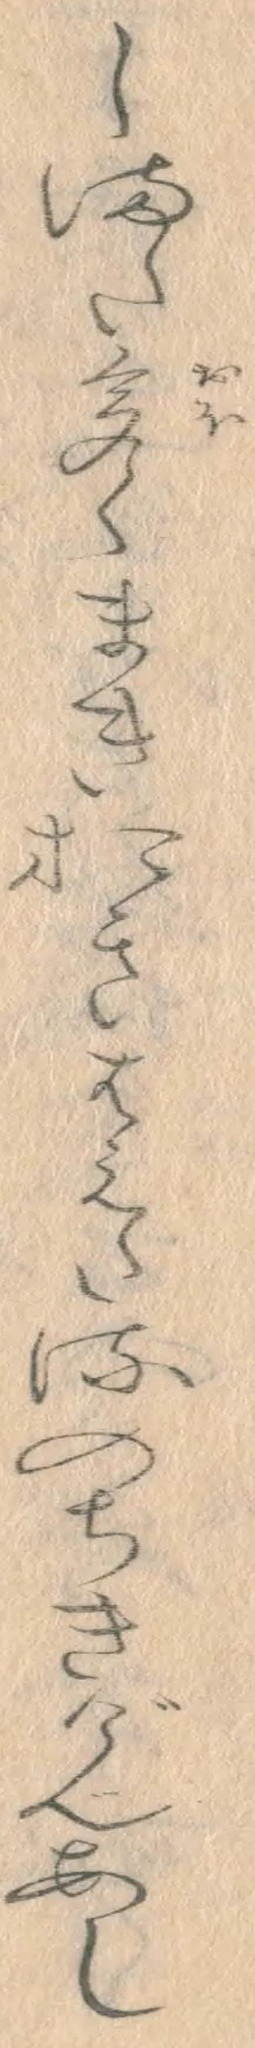しまた多くまきおきはえたるのちきげんあし
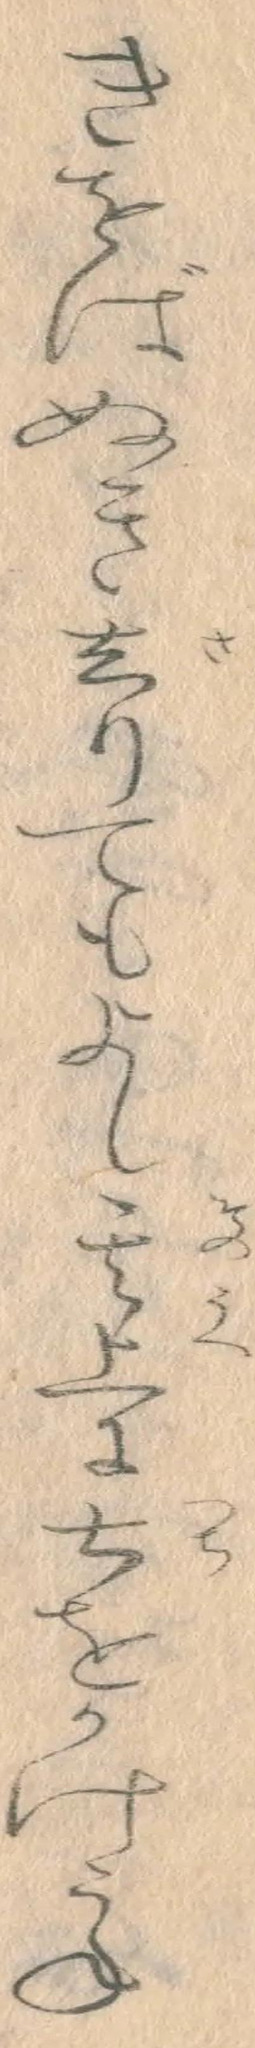きをばぬき去りてもよし其上に土をかけうね
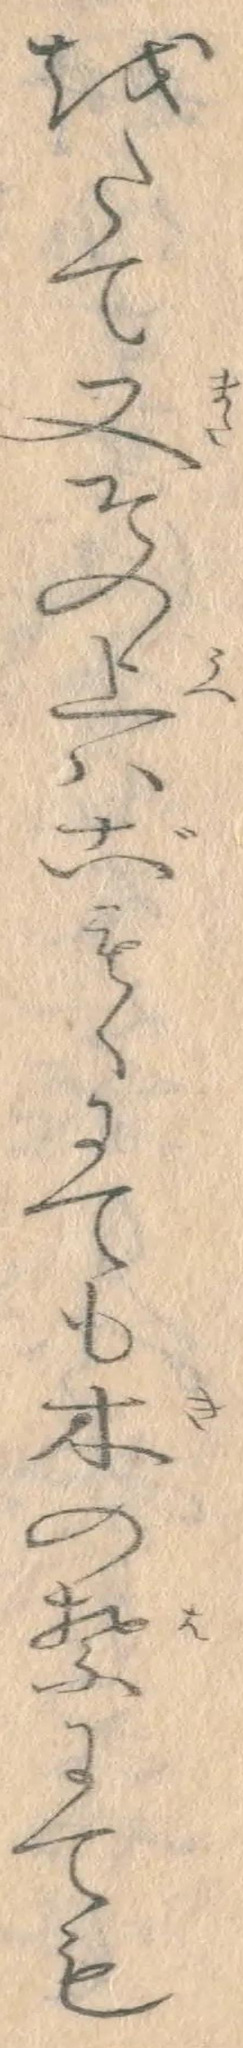をたて又その上はごもくにても木の葉にても
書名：蚕茶并紙木植方書
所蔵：国立国会図書館 National Diet Library, JAPAN
